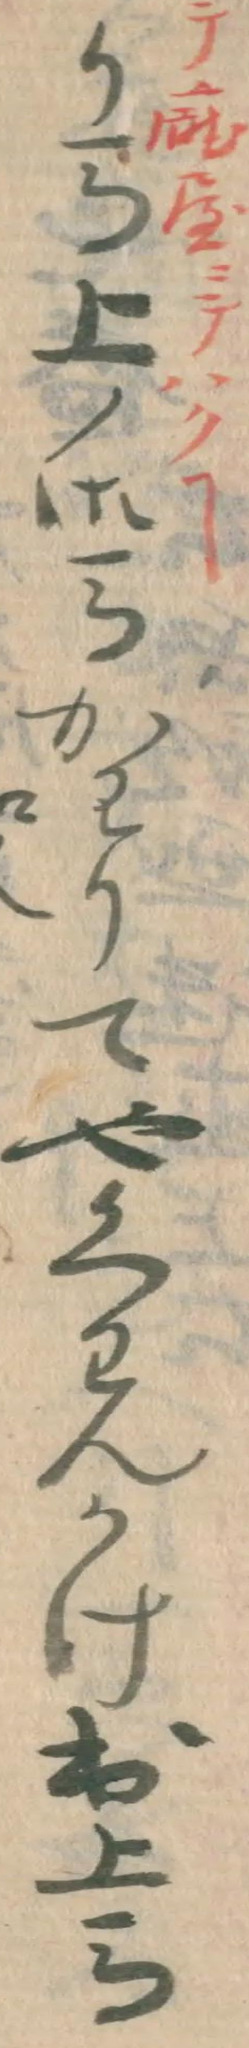り馬上ノ御馬かわりてやくわんかけ出上馬
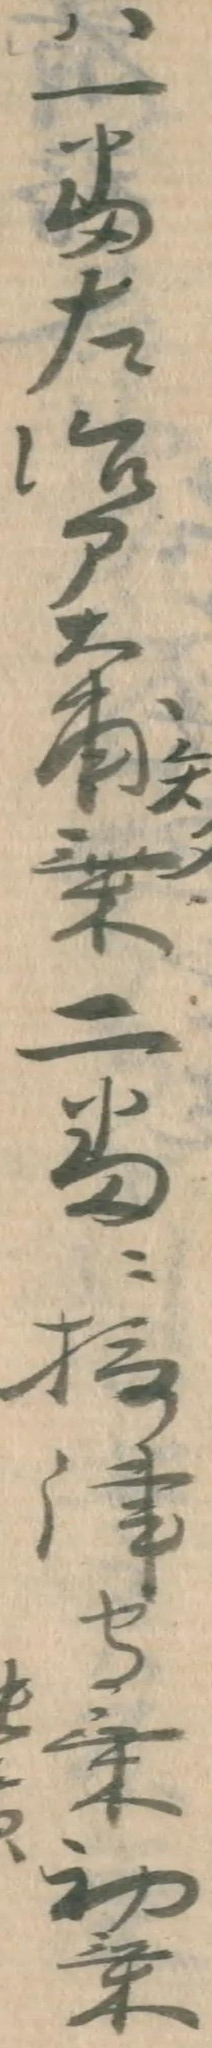ハ一番左治部大輔乗二番ニ摂津守乗初乗
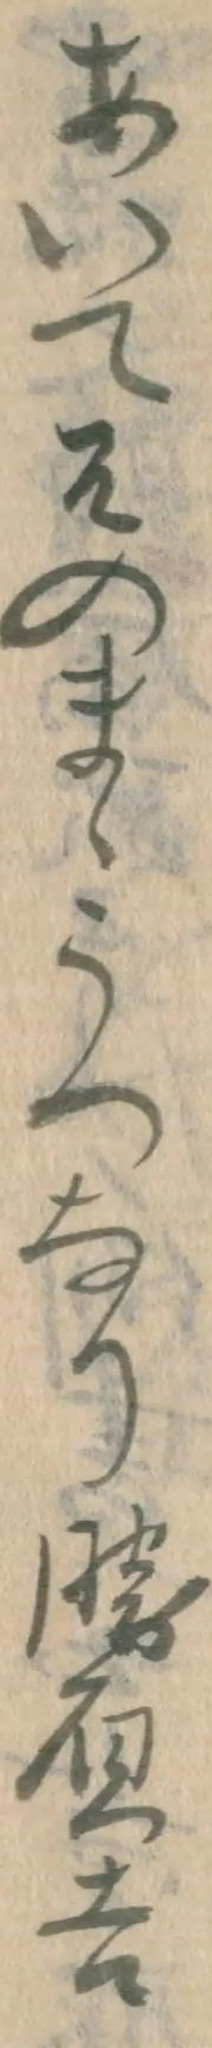あいてそのまゝうつなり勝負吉
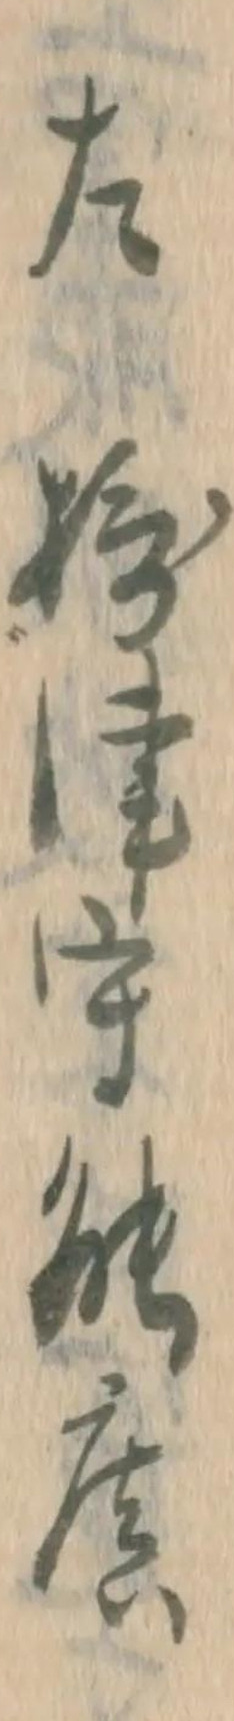左摂津守能廣
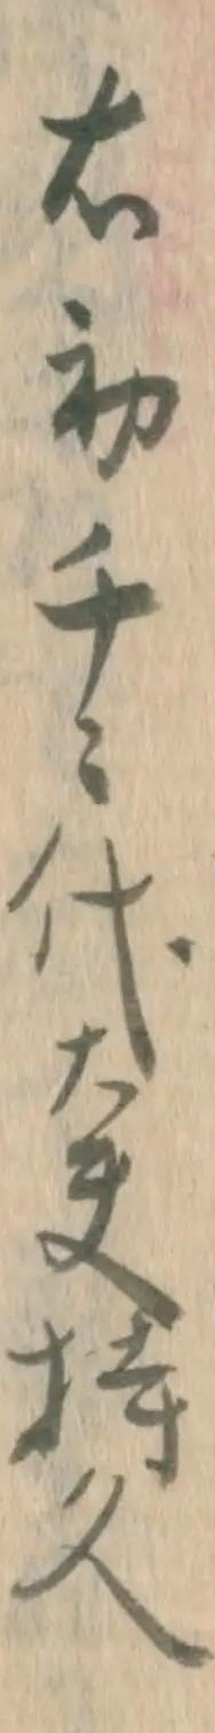右初千々代大夫持久
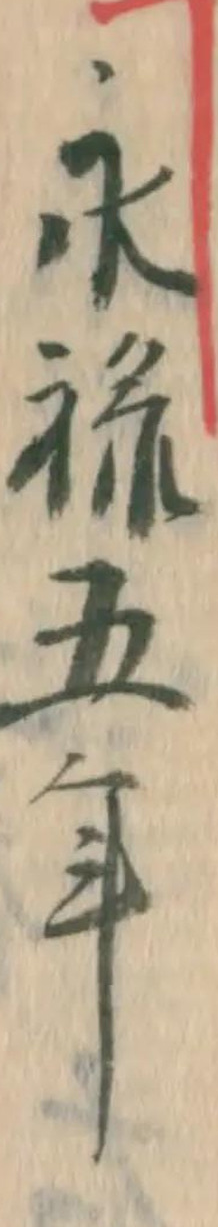永禄五年
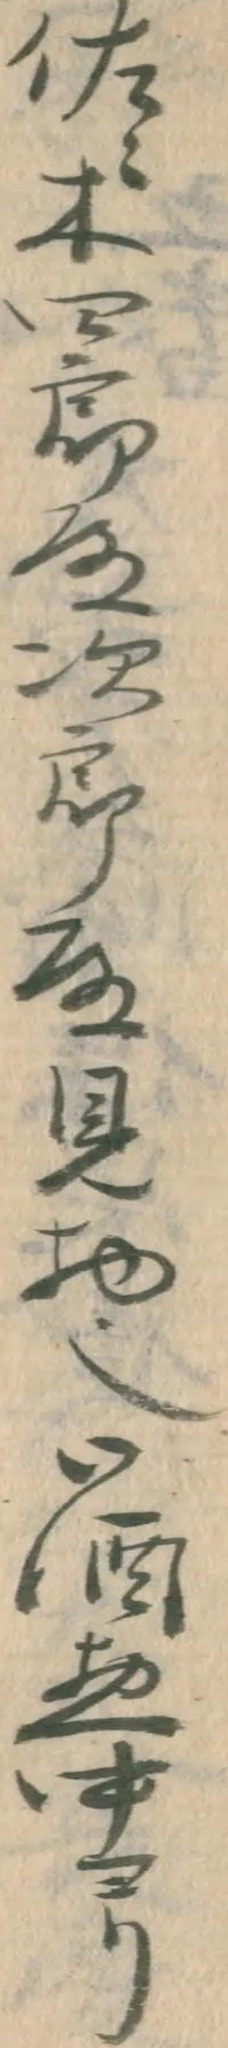佐々木四郎殿次郎殿見物也御酒惣中ヨリ
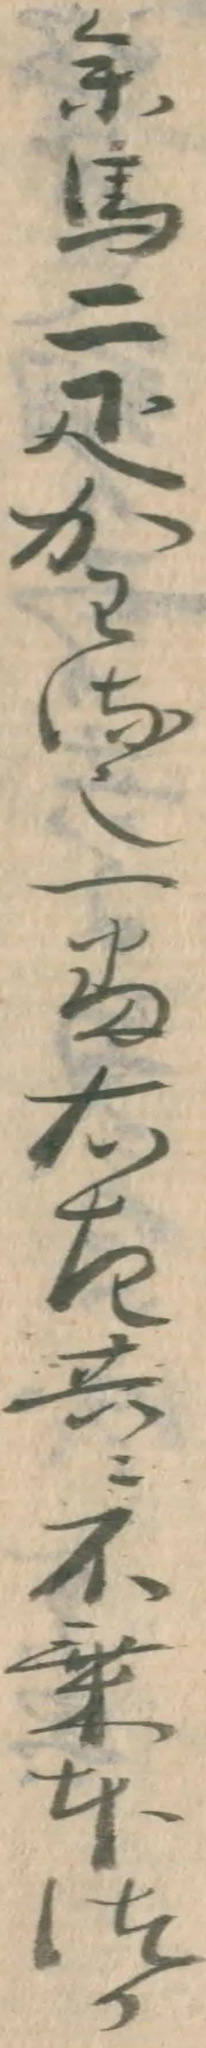参馬二疋かわる也一番右左共ニ不乗本つか
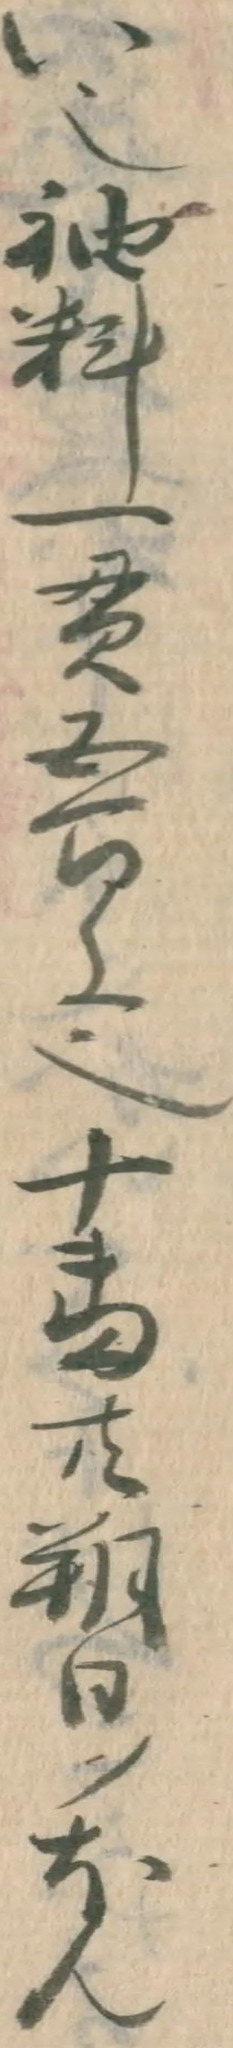い也袖料一貫五百文也十番共朔日ノほん
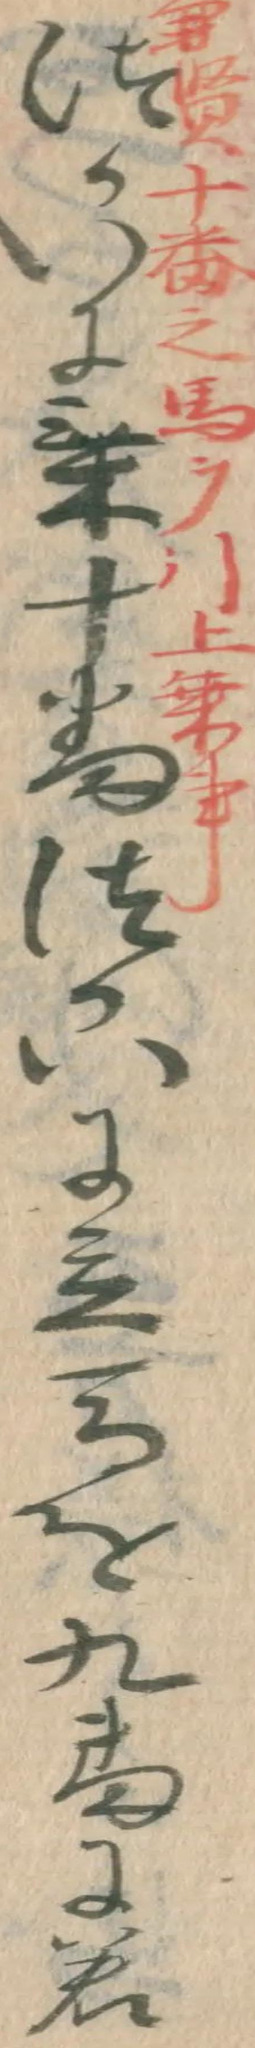つかいに乗十番つかいに立馬を九番に若
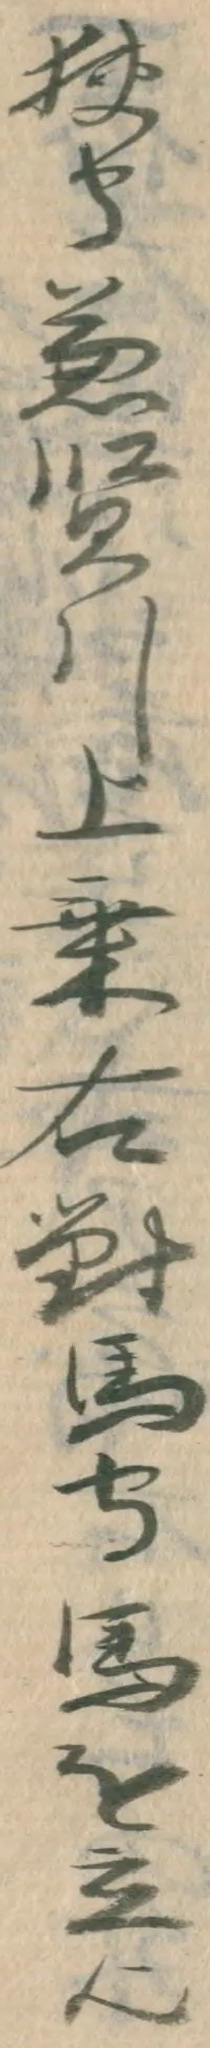狭守兼賢引上乗右対馬守馬を立也
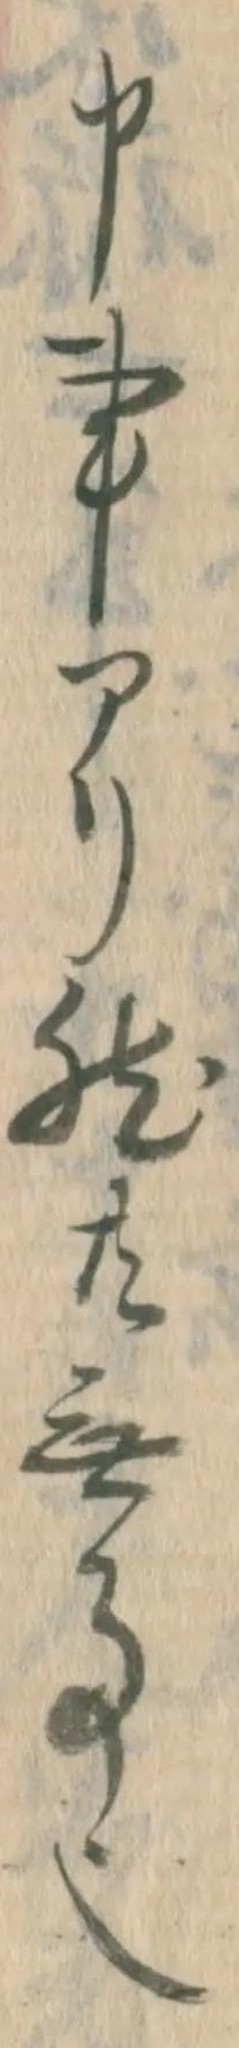申事アリ然共無事也
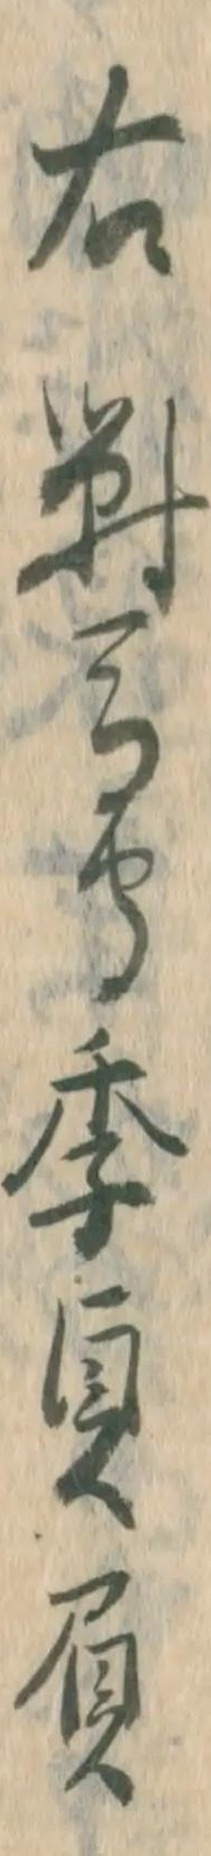右対馬守季貞負

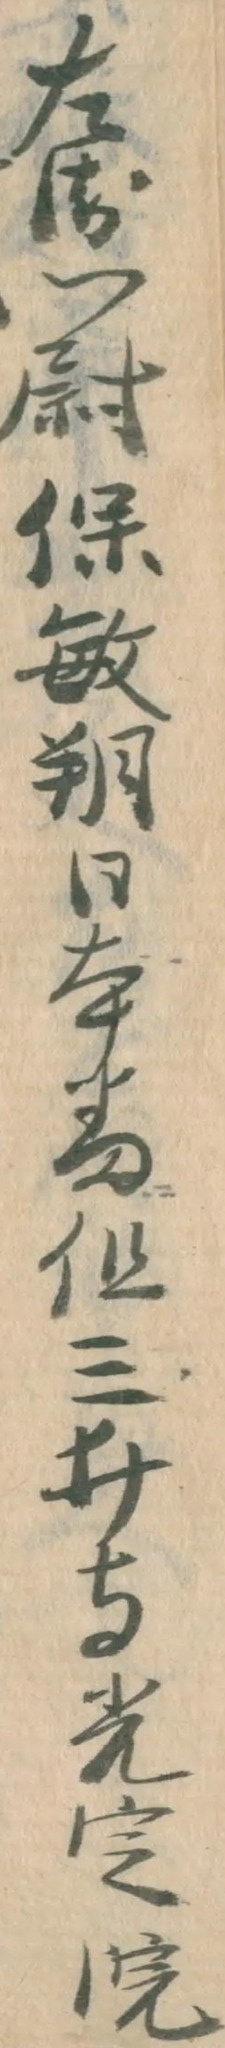左衛門尉保敏朔日本番但三井寺光定院
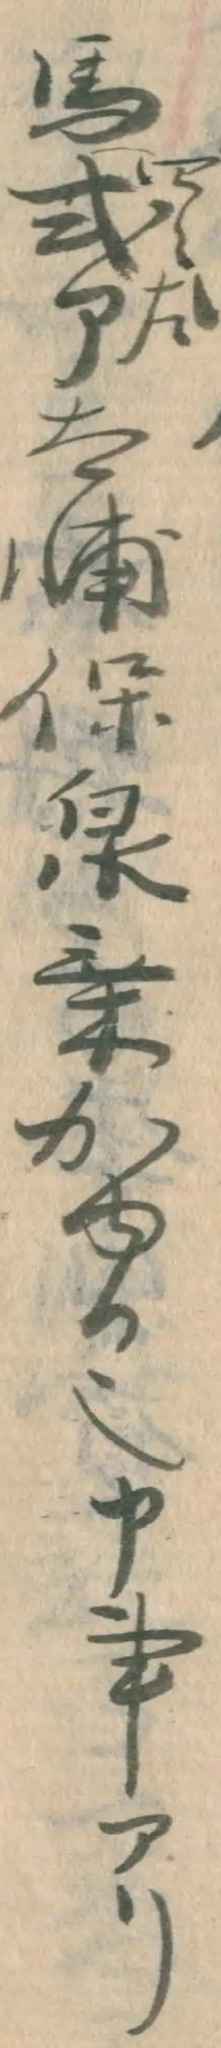馬式部太輔保泉乗かゆる也申事アリ
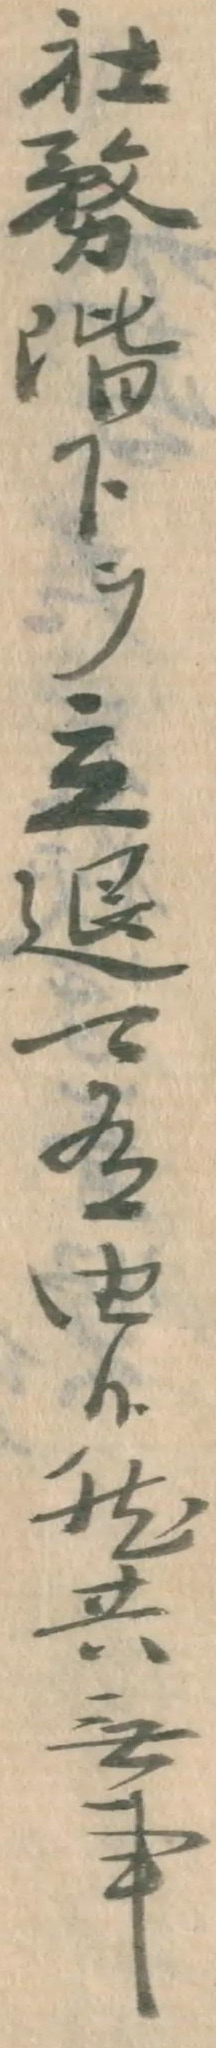社務階下ヲ立退可有由候然共無事
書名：賀茂社記録. 第10冊
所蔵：国立国会図書館 National Diet Library, JAPAN
